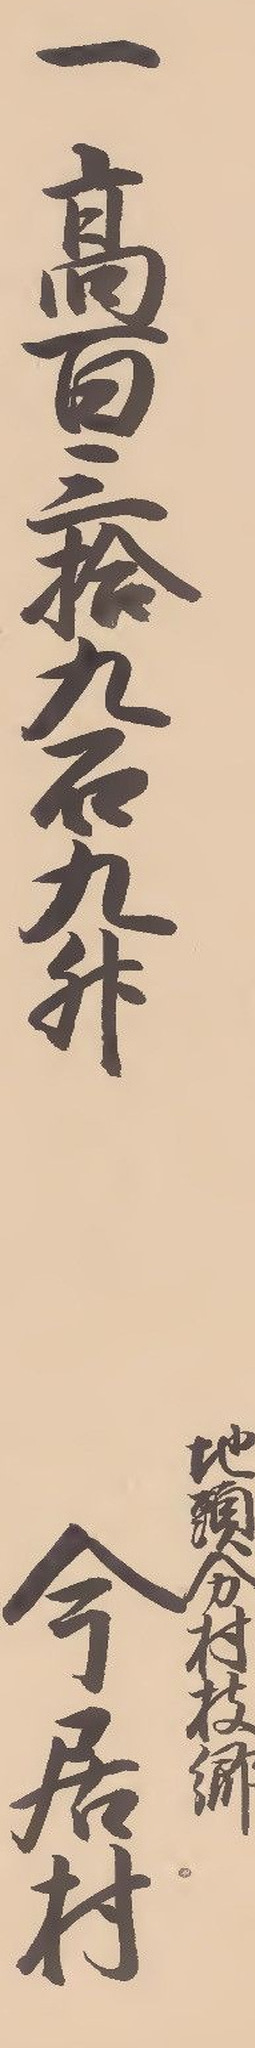一髙百三拾九石九升今居村
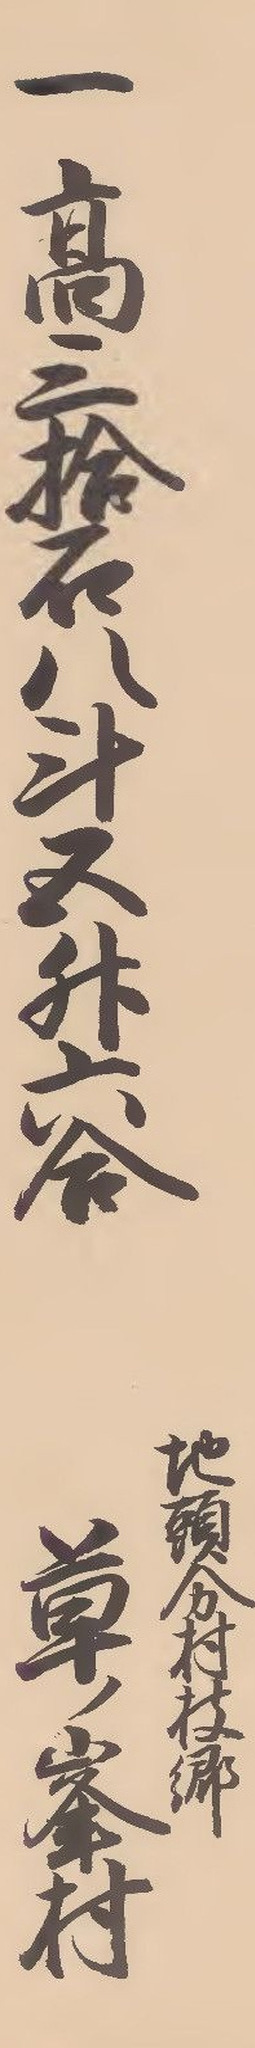一髙三拾石八斗五升六合草ノ峯村

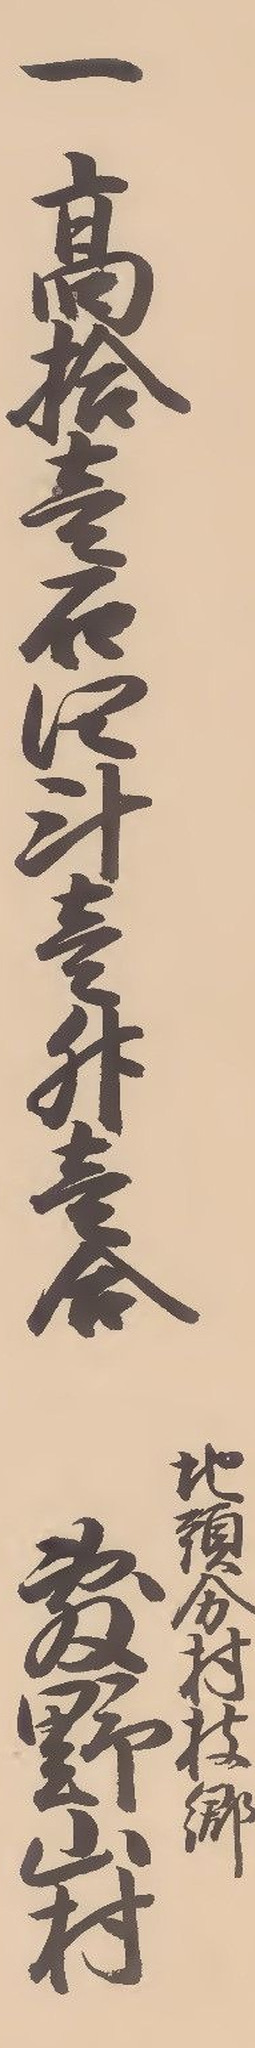一髙拾壱石四斗壱升壱合敷野山村
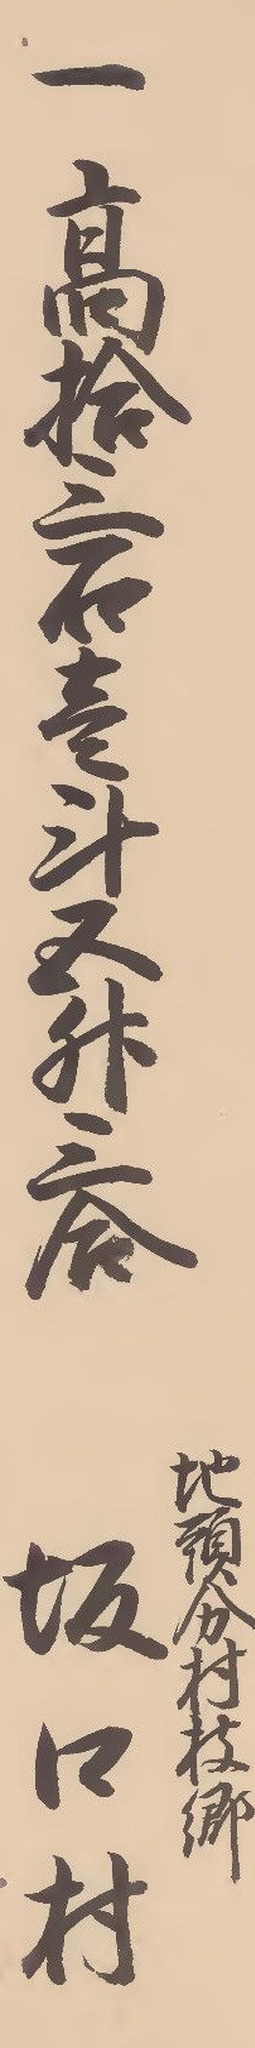一髙拾三石壱斗五升三合坂口村
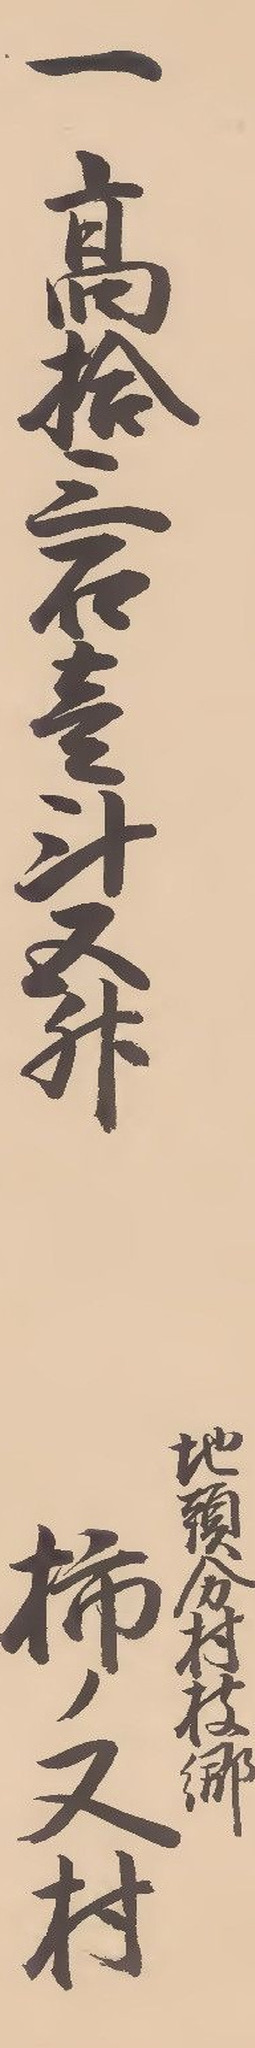一髙拾三石壱斗五升柿ノ又村
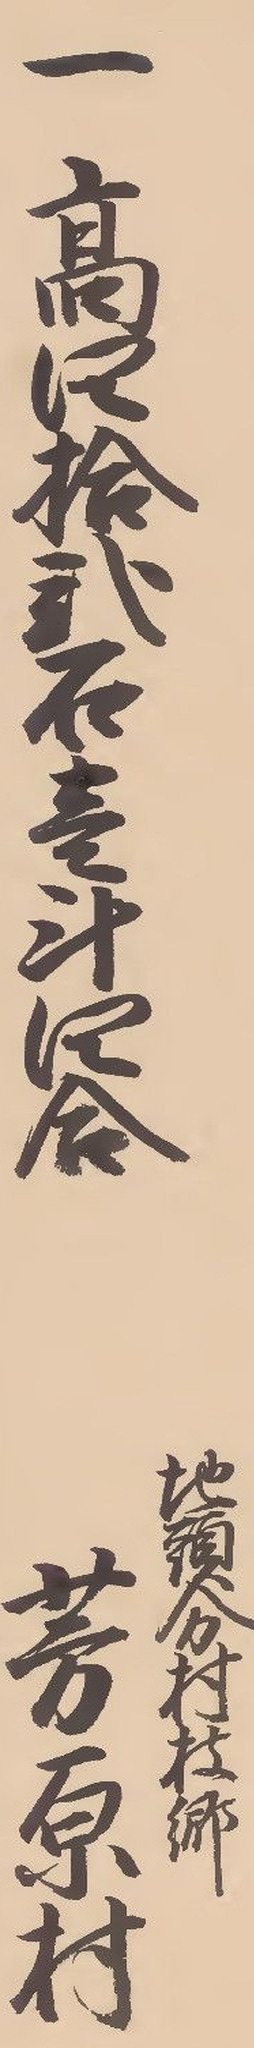一髙四拾弐石壱斗四合芳原村
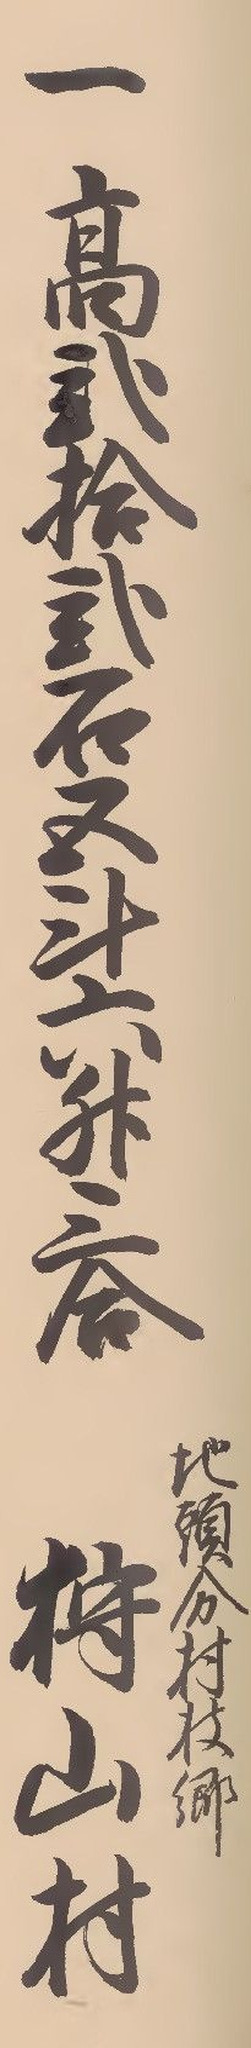一た弐拾弐石五斗六升三合狩山村
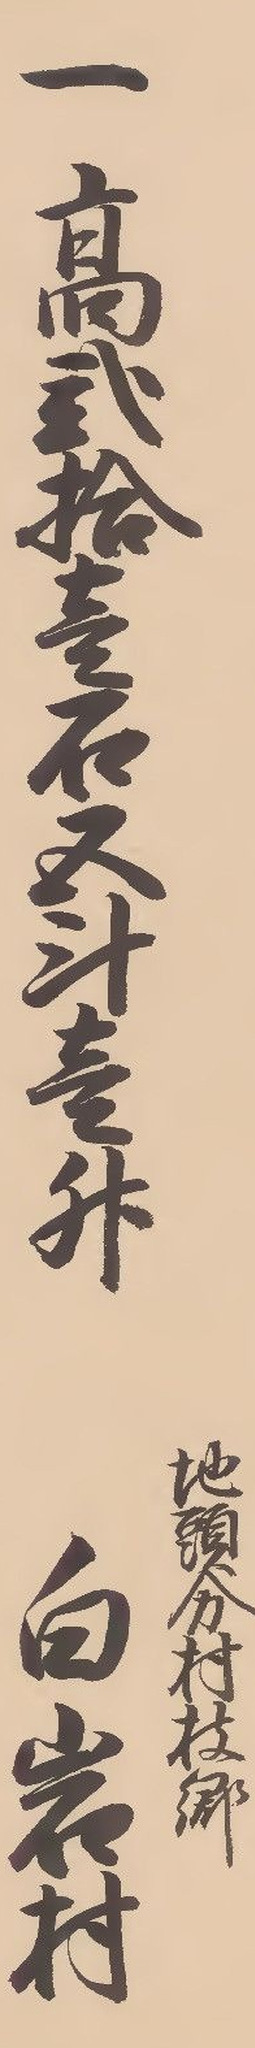一髙弐拾壱石五斗壱升白岩村
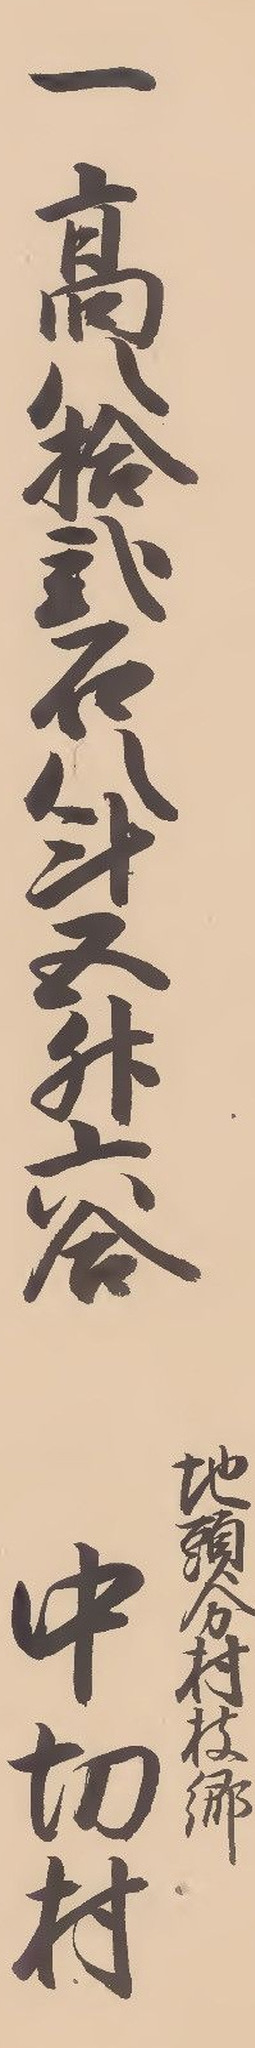一髙八拾弐石八斗五升六合中切村
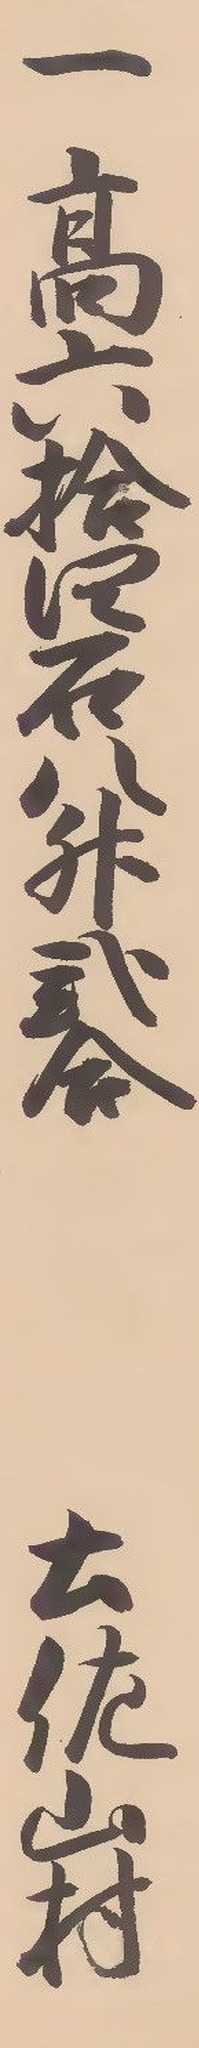一髙六拾四石八升弐合土佐山村

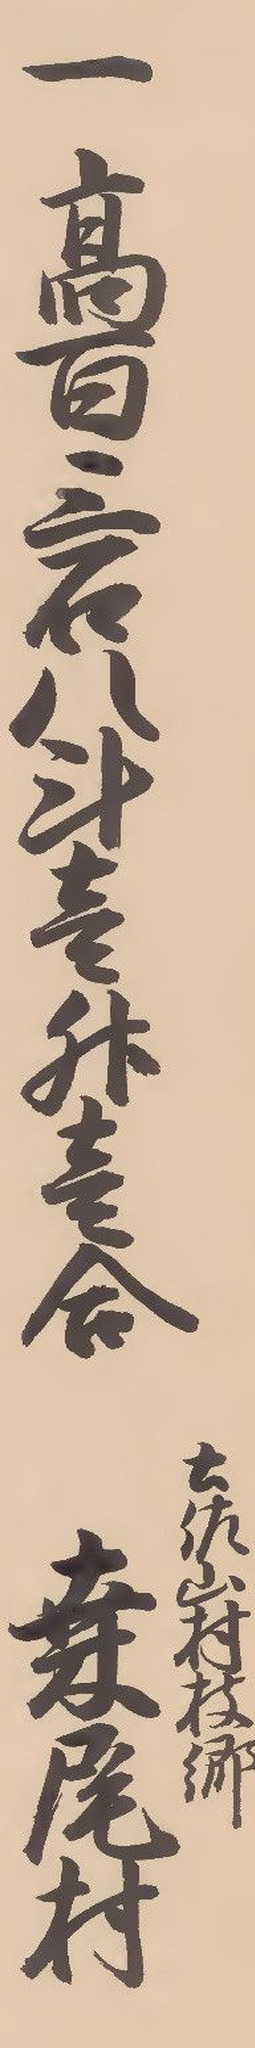一髙百三石八斗壱升壱合桑尾村
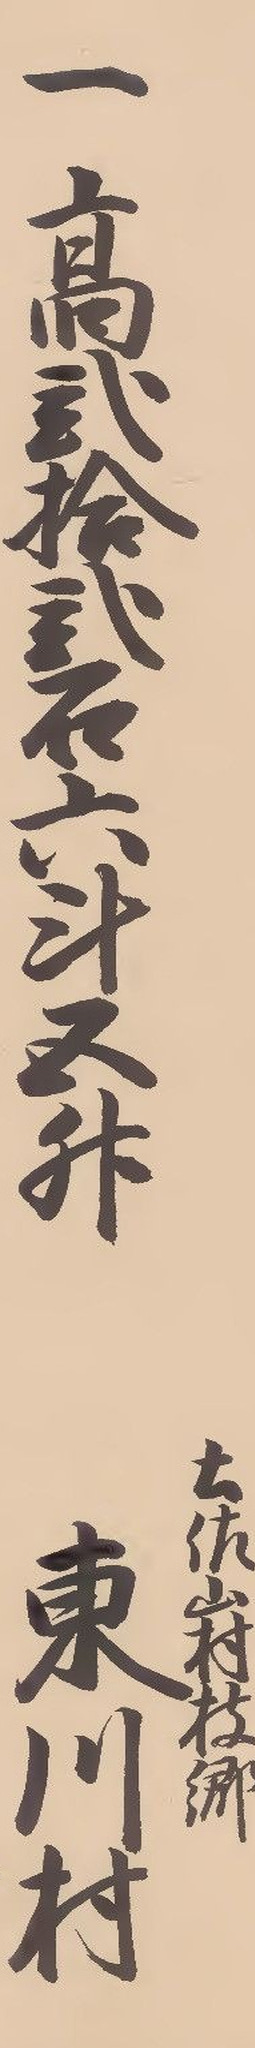一髙弐拾弐石六斗五升東川村
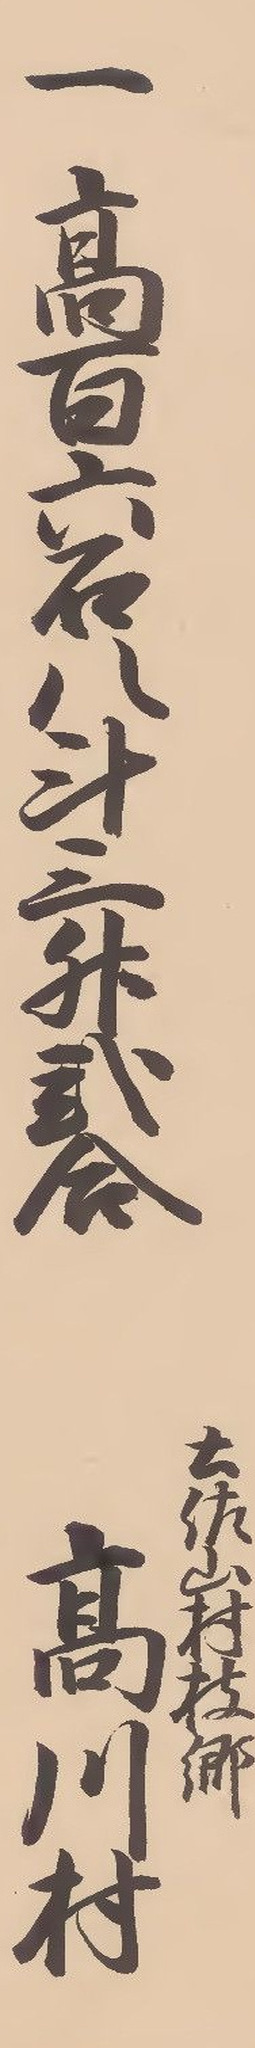一髙百六石八斗三升弐合髙川村
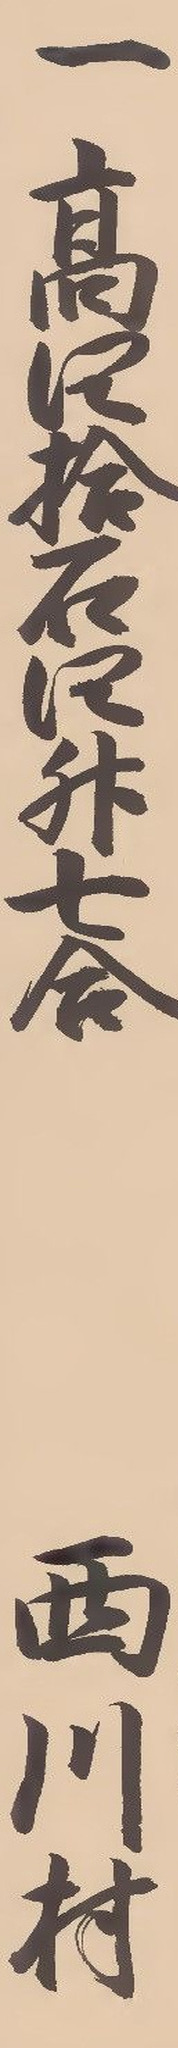一髙四拾石四升七合西川村
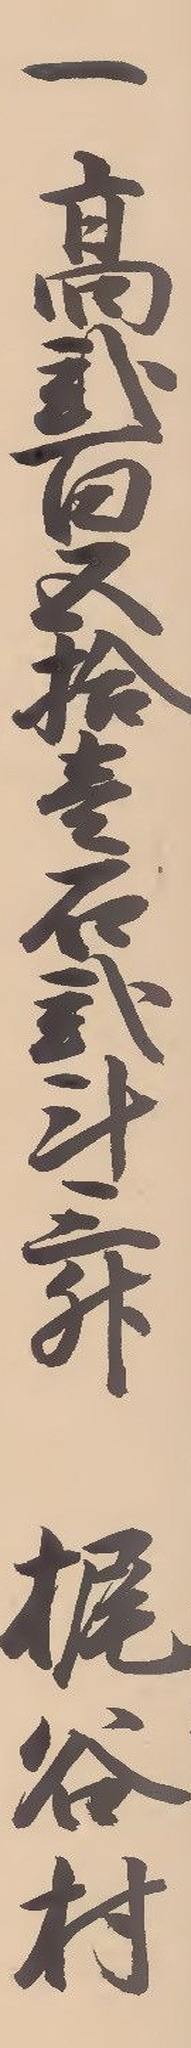一髙弐百五拾壱石弐斗三升梶谷村
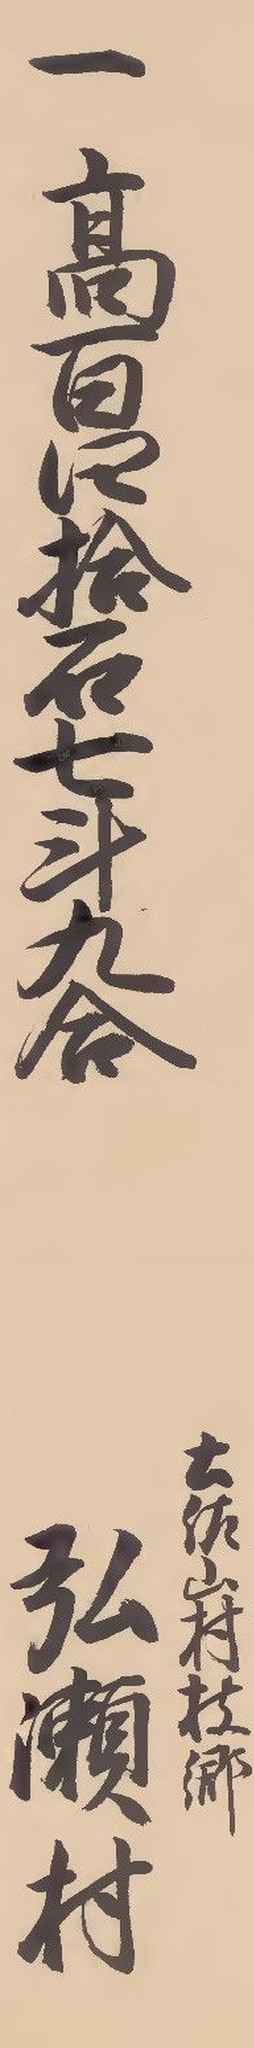一髙百四拾石七斗九合弘瀬村
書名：土佐国郷帳
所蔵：国立公文書館 National Archives of Japan
